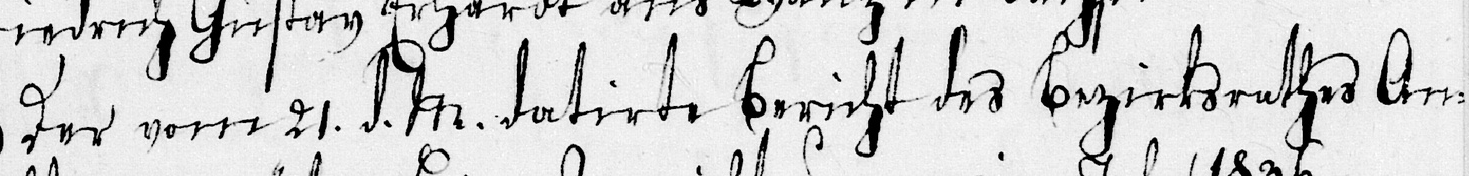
Der vom 21. d. M. datirte Bericht des Bezirksrathes An¬
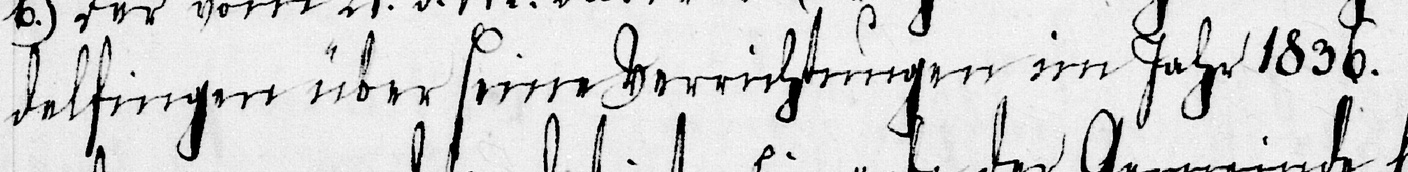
delfingen über seine Verrichtungen im Jahr 1836.
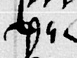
vers¬
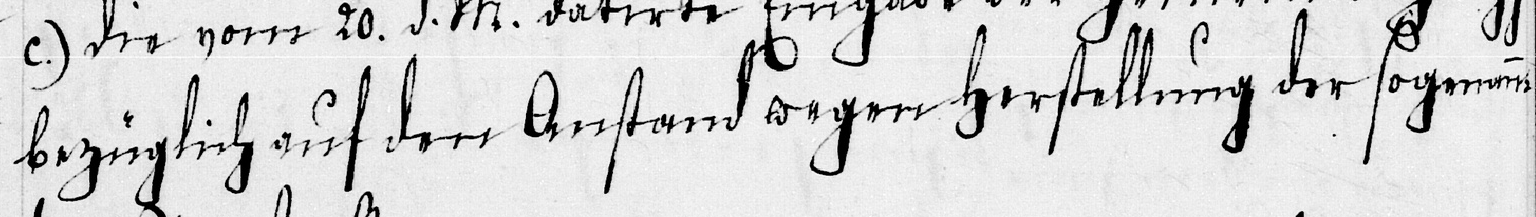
bezüglich auf den Anstand wegen Herstellung der sogenan¬
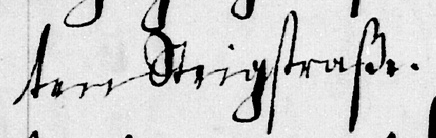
nten Steigstraße.
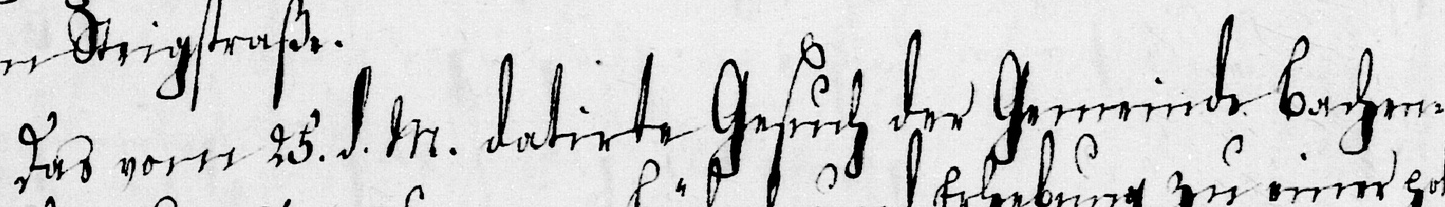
Das vom 25. d. M. datirte Gesuch der Gemeinde Bache¬
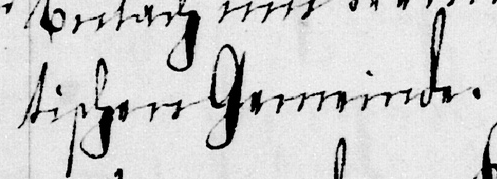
tischen Gemeinde.
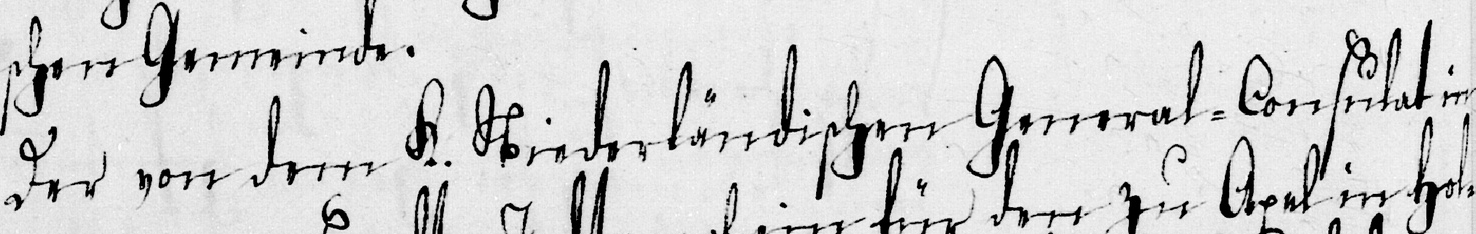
Der von dem K. Niederländischen General-Consulat in
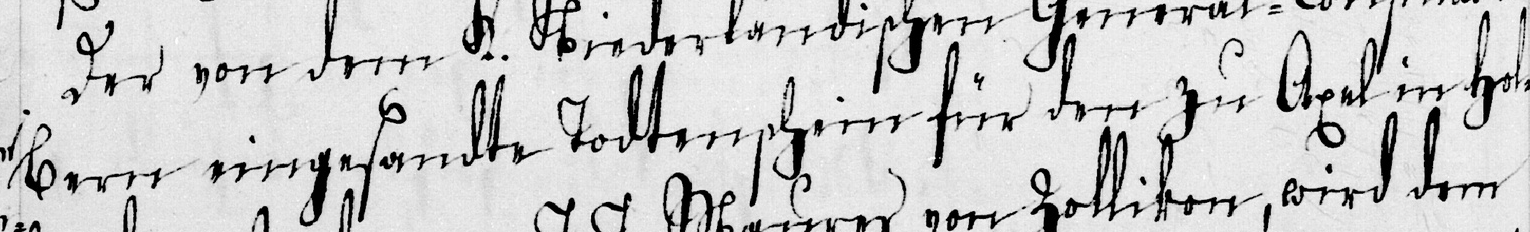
Bern eingesandte Todtenschein für den zu Axel in Ho¬
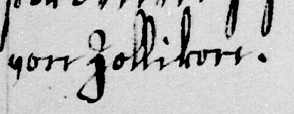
von Zollikon,
